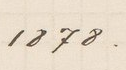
1878.
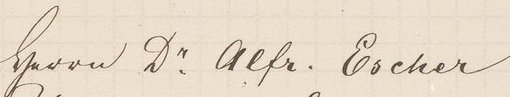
Herrn Dr Alfr. Escher
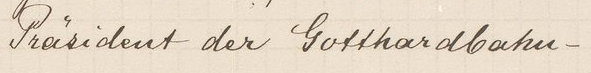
Präsident der Gotthardbahn–Direction
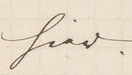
hier.
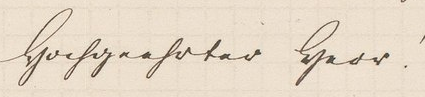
Hochgeehrter Herr!
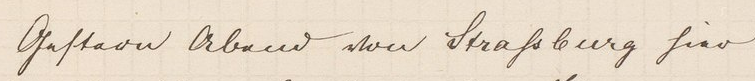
Gestern Abend von Strassburg hier
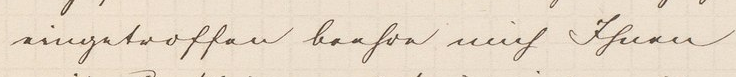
eingetroffen beehre mich Ihnen
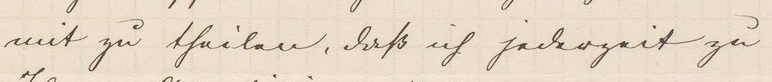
mit zu theilen, daß ich jederzeit zu
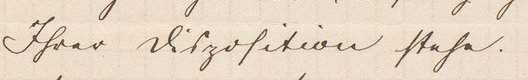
Ihrer Disposition stehe.
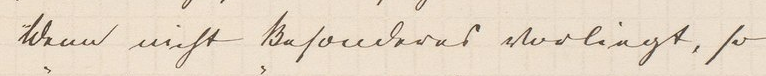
Wenn nicht Besonderes vorliegt, so
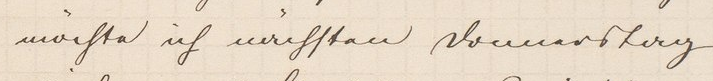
möchte ich nächsten Donnerstag
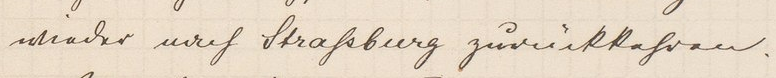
wieder nach Strassburg zurückkehren.
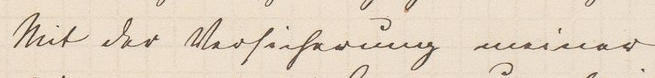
Mit der Versicherung meiner
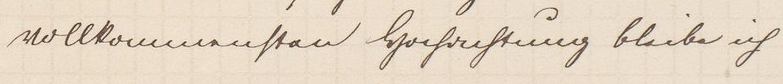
vollkommensten Hochachtung bleibe ich
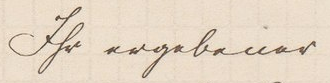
Ihr ergebener
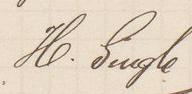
H. Single
